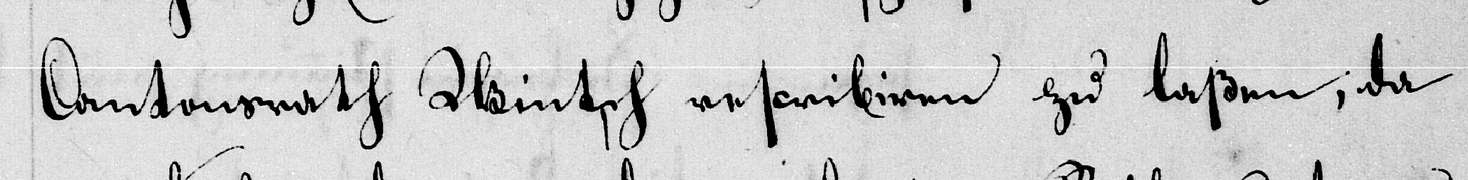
Cantonsrath Wintsch rescribiren zu laßen, da
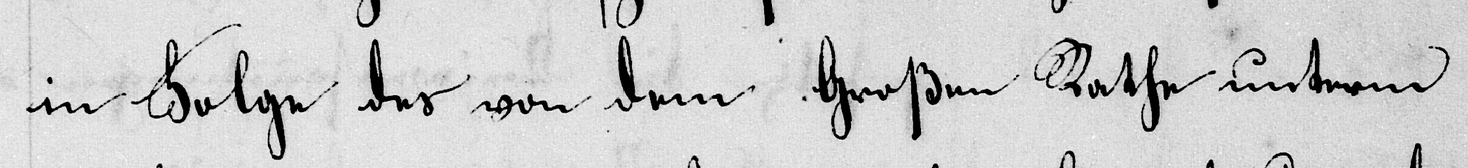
in Folge des von dem Großen Rathe unterm
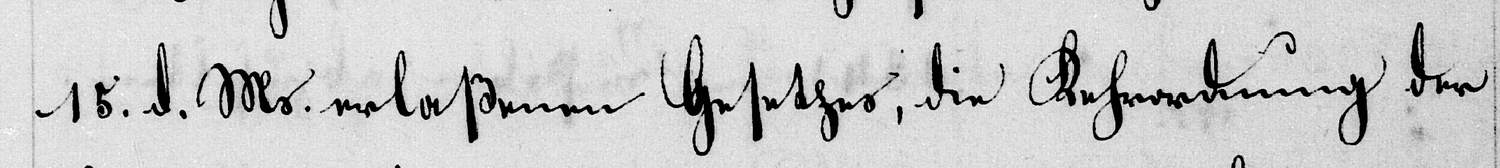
15. d. Ms. erlaßenen Gesetzes, die Kehrordnung der
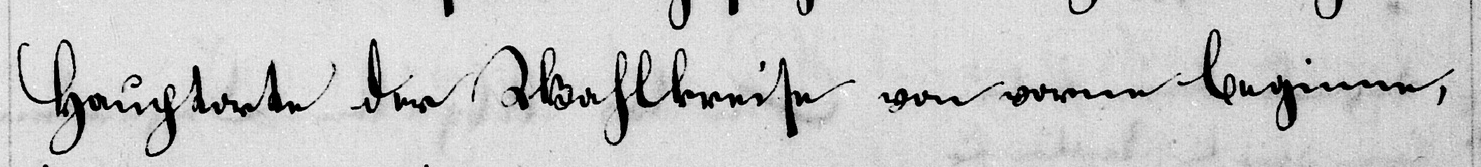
Hauptorte der Wahlkreise von vorne beginne,
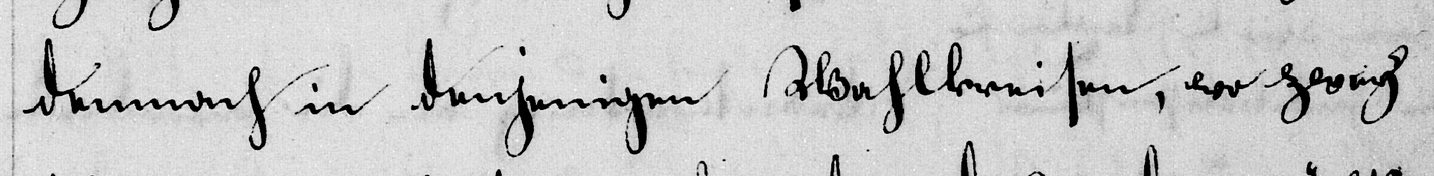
demnach in denjenigen Wahlkreisen, wo zwey
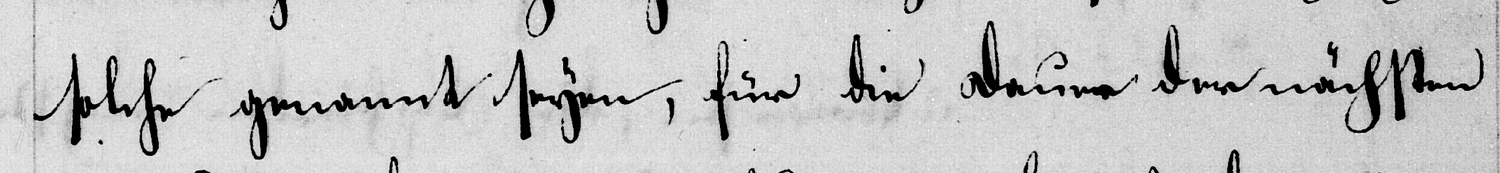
solche genannt seyen, für die Dauer der nächsten
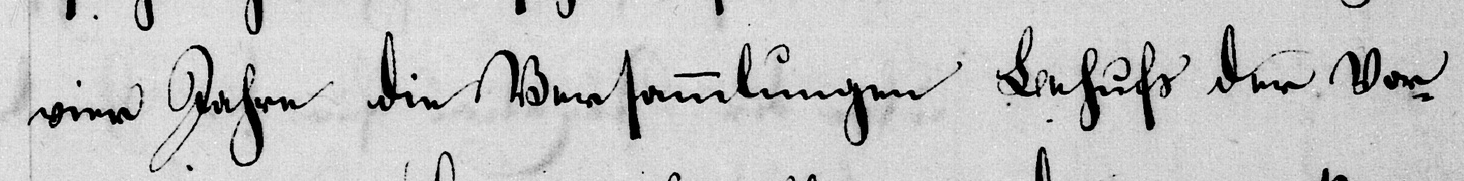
vier Jahre die Versammlungen Behufs der Vor¬
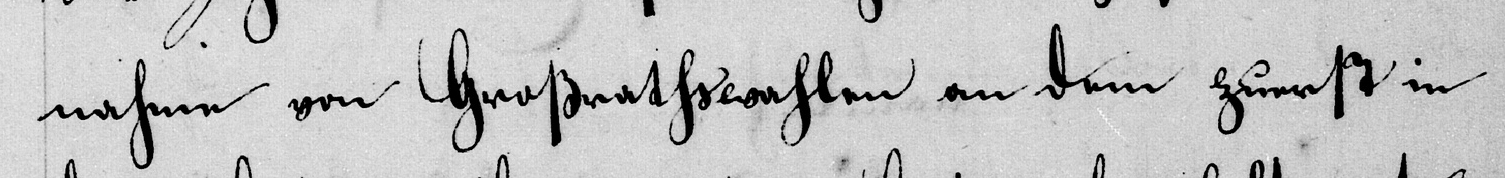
nahme von Großrathswahlen an dem zuerst in
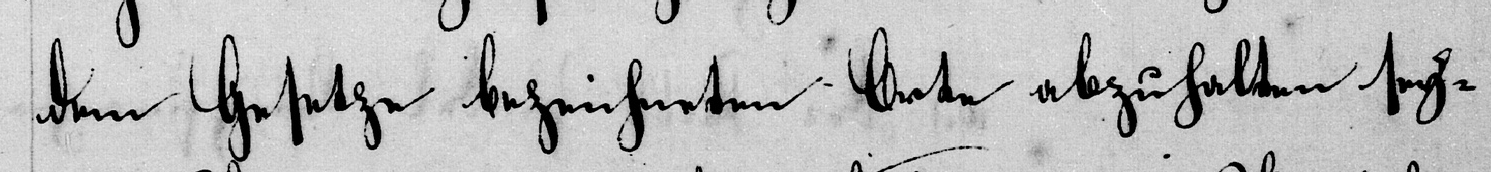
dem Gesetze bezeichneten Orte abzuhalten sey¬
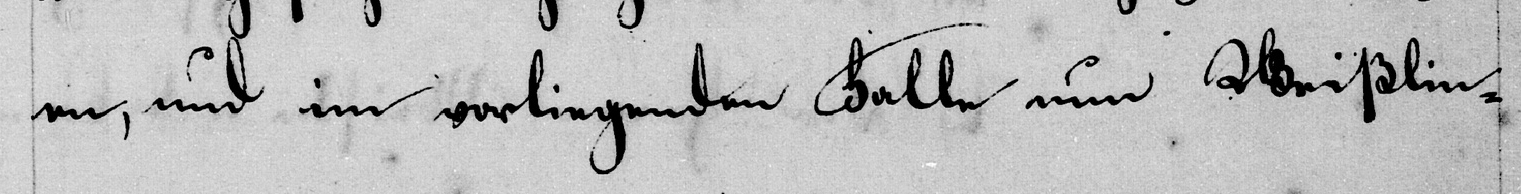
en; und im vorliegenden Falle nun Weißlin-
